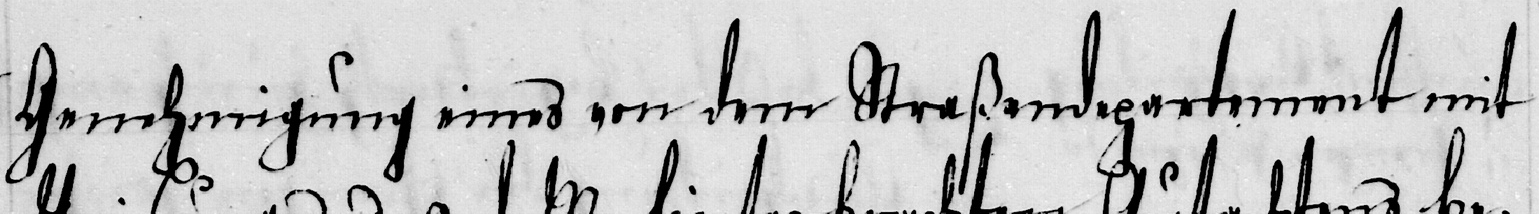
Genehmigung eines von dem Straßendepartement mit
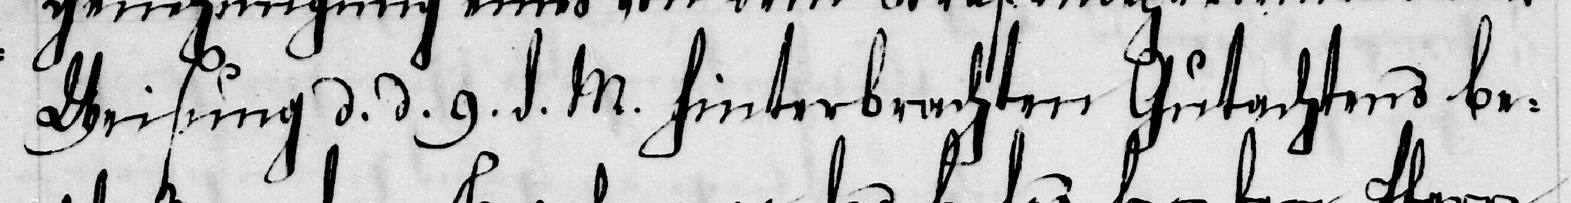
Weisung d. d. 9. d. M. hinterbrachten Gutachten be¬
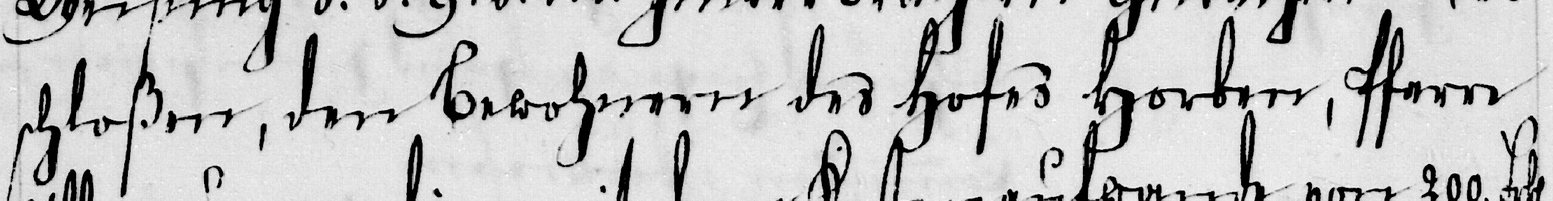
schloßen, den Bewohnern des Hofes Horben, Pfarre
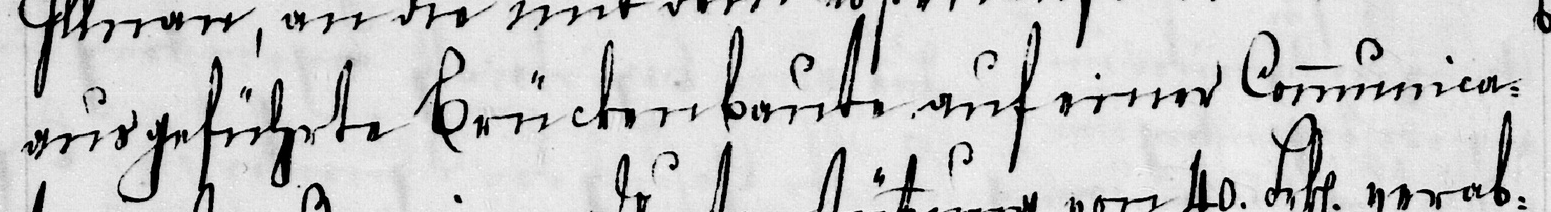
ausgeführte Brückenbaute auf einer Communica¬
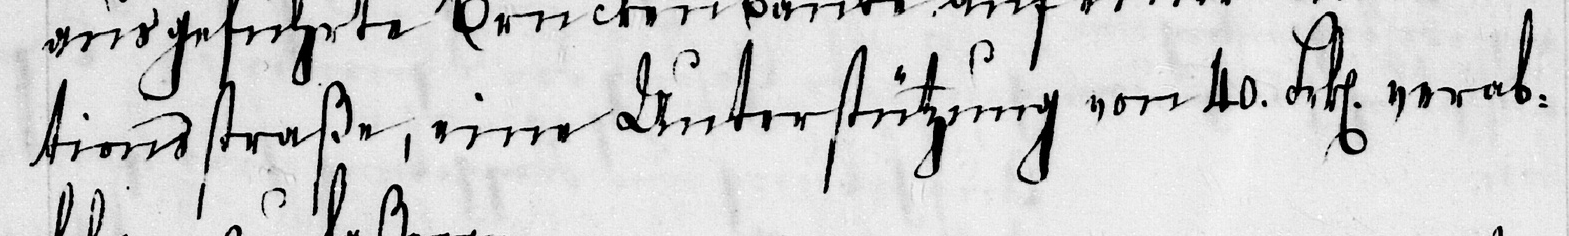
tionsstraße, eine Unterstützung von 40. Frk[en]. verab¬
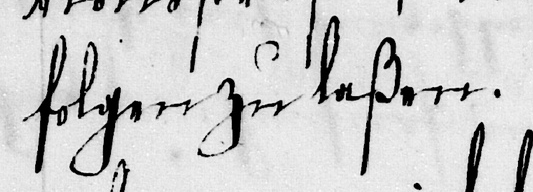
folgen zu laßen.
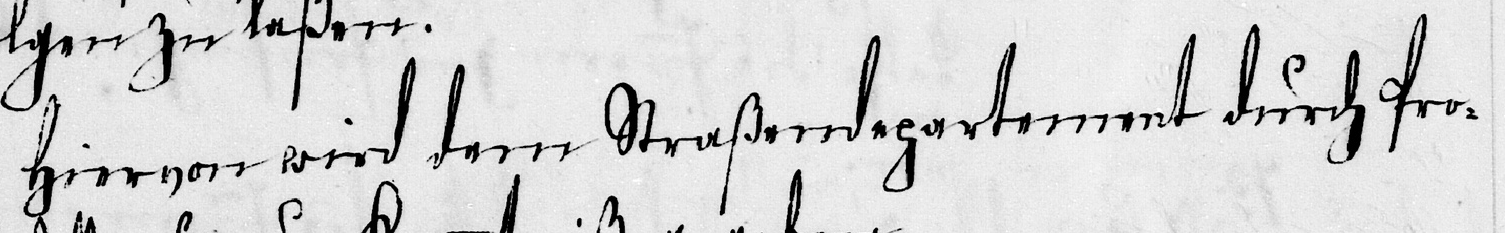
Hiervon wird dem Straßendepartement durch Pro¬
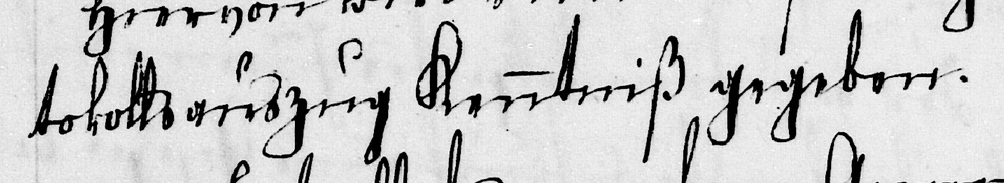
tokollsauszug Kenntniß gegeben.
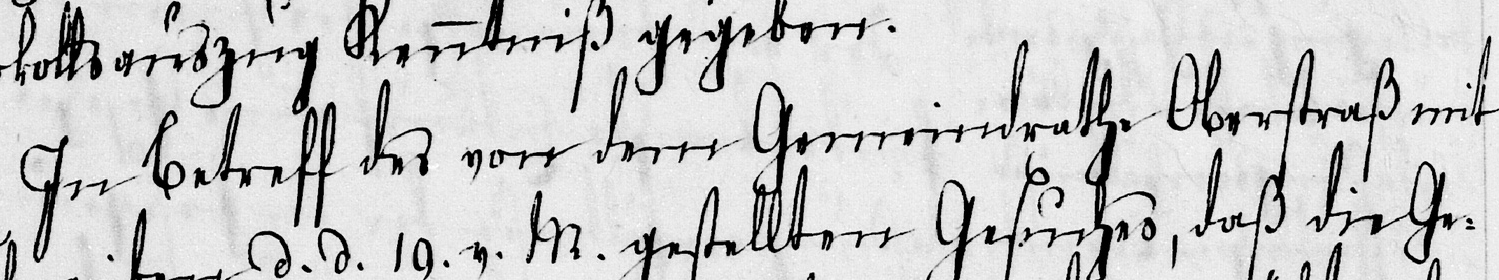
In Betreff des von dem Gemeindrathe Oberstraß mit
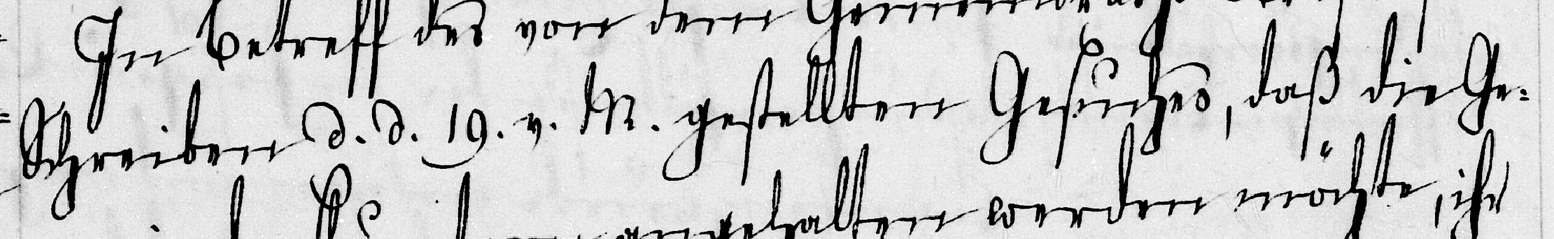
Schreiben d. d. 19. v. M. gestellten Gesuches, daß die Ge¬
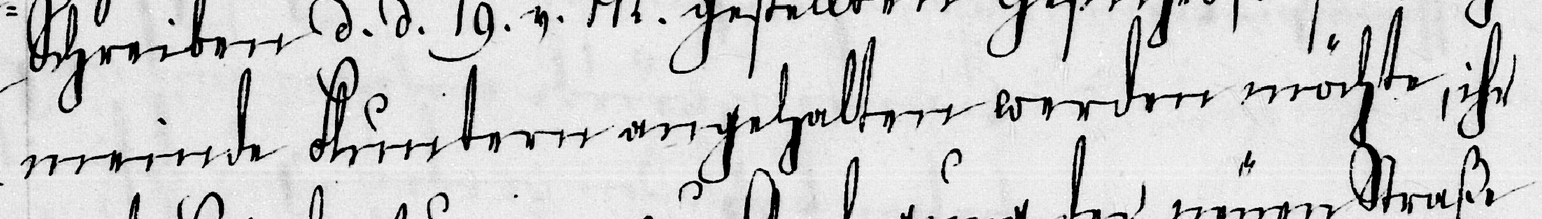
meinde Fluntern angehalten werden möchte, ihr
